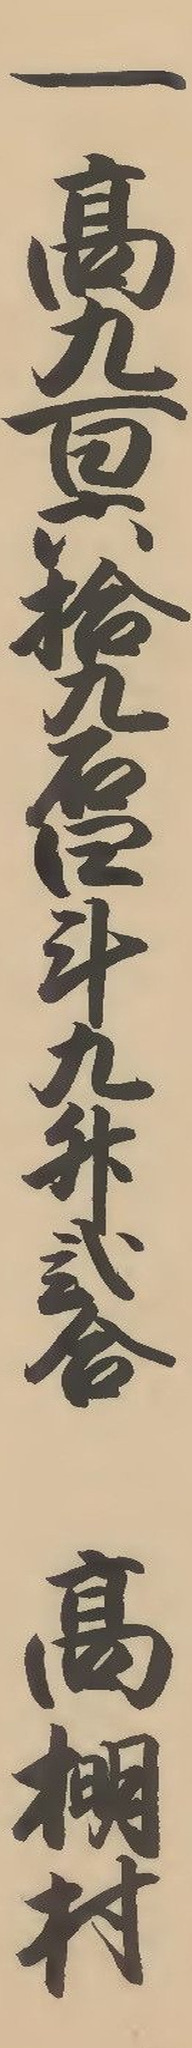一高九百六拾九石四斗九升弐合高棚村
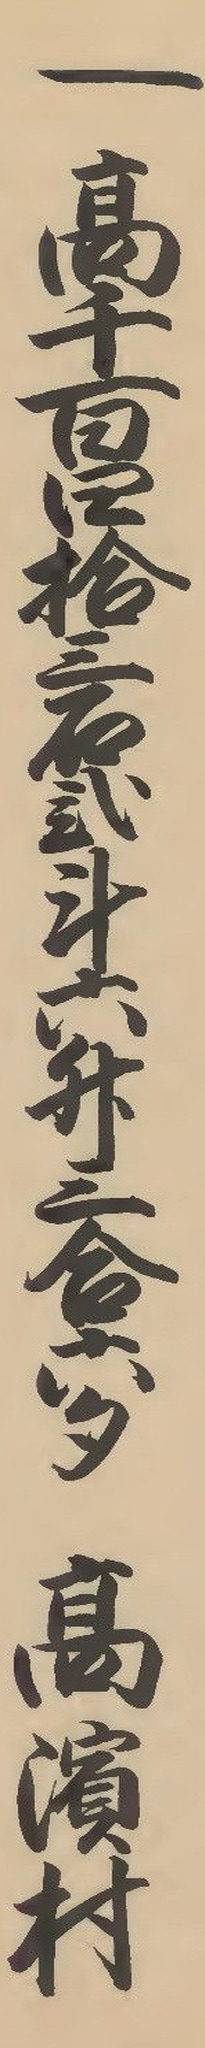一高千百四拾三石弐斗六升三合六勺高浜村
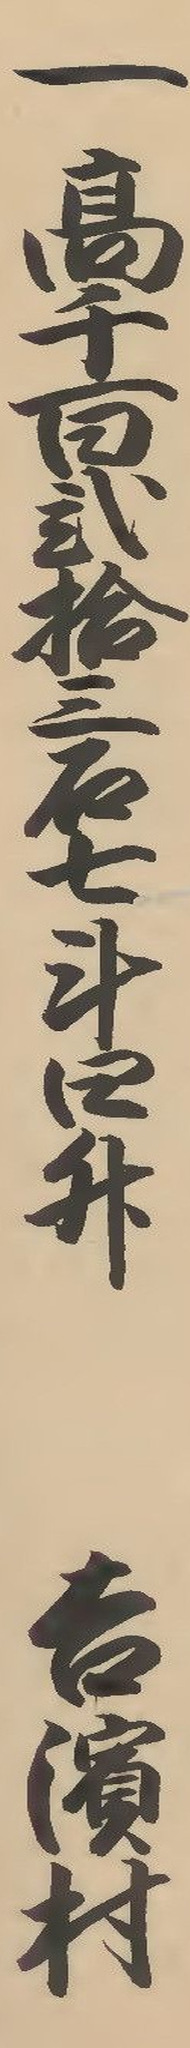一高千百弐拾三石七斗四升吉浜村
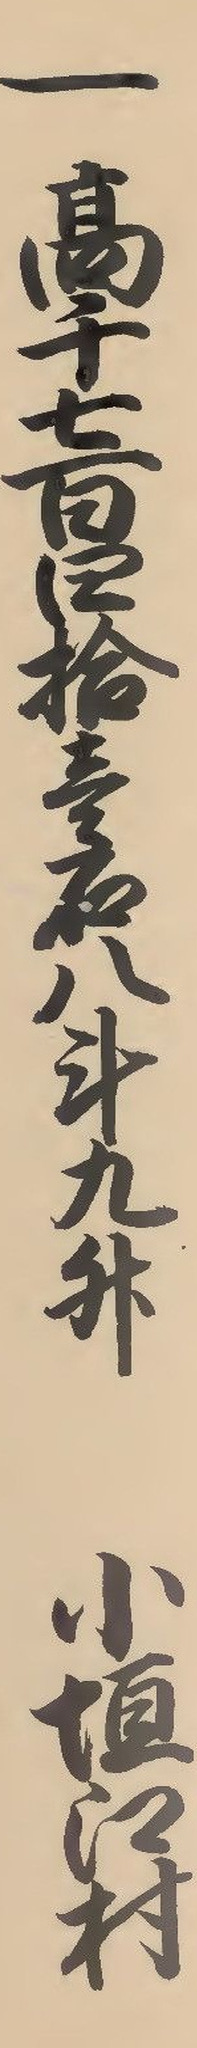一高千七百四拾壱石八斗九升小垣江村
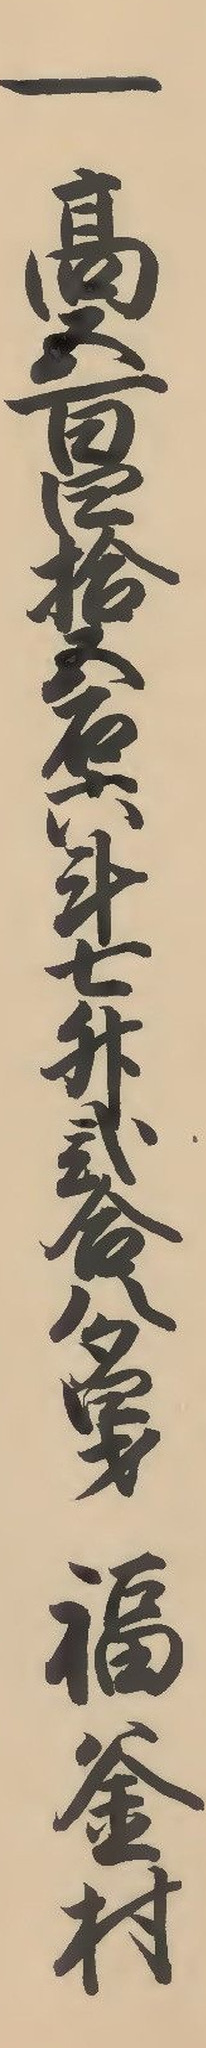一高五百四拾五石六斗七升弐合八勺四才福釜村
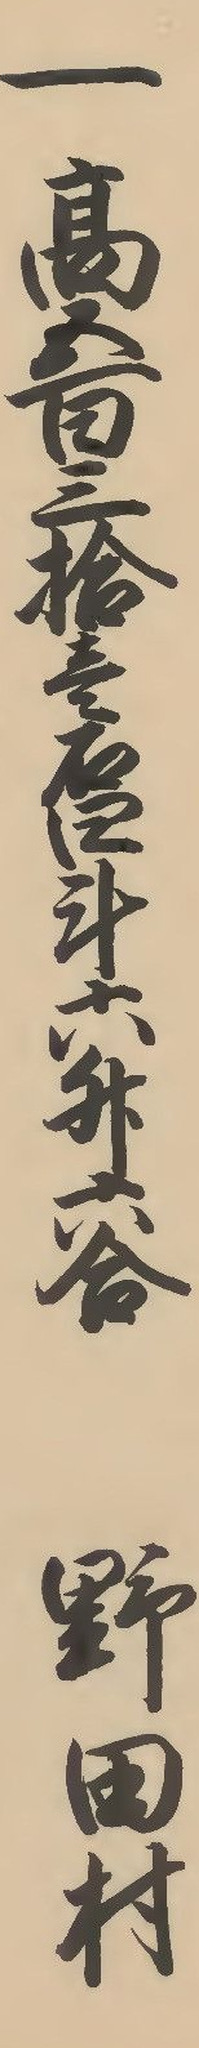一高五百三拾壱石四斗六升六合野田村

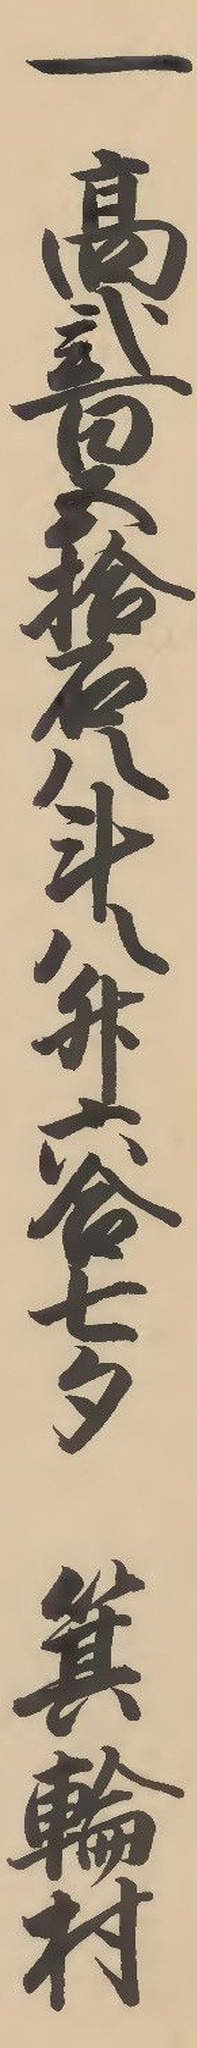一高弐百五拾石八斗八升六合七勺箕輪村
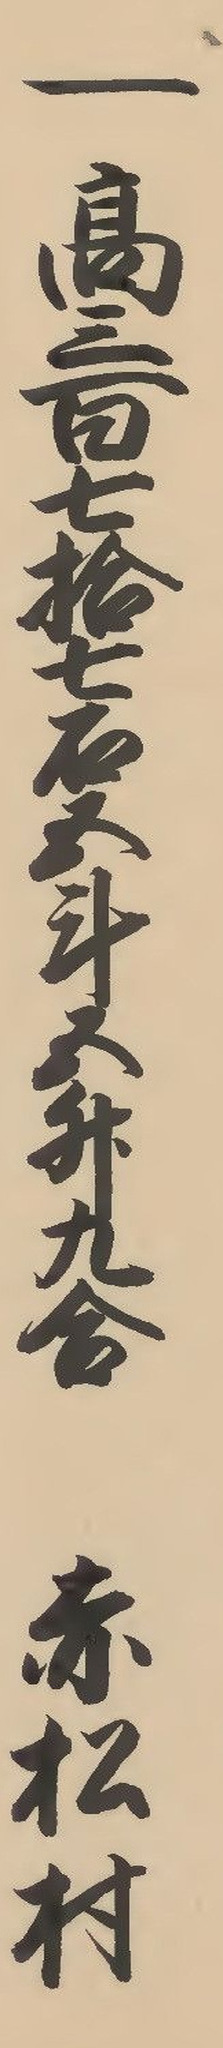一高三百七拾七石五斗五升九合赤松村
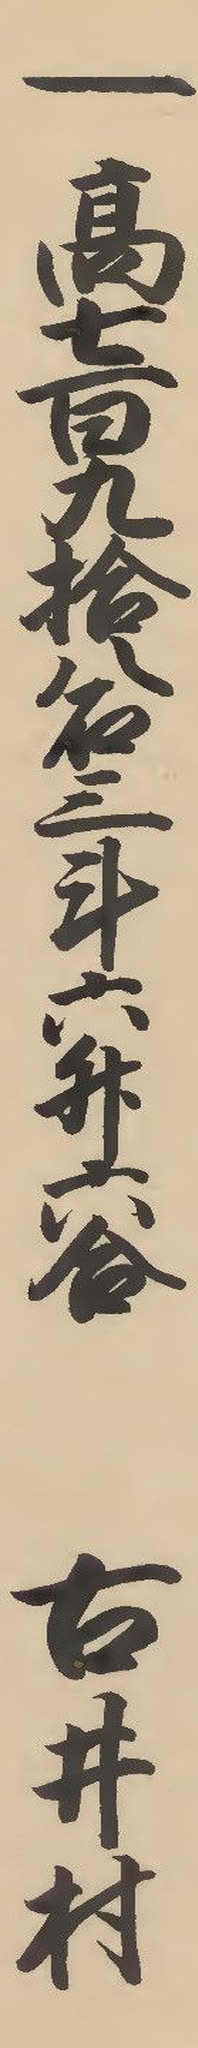一高七百九拾八石三斗六升六合古井村
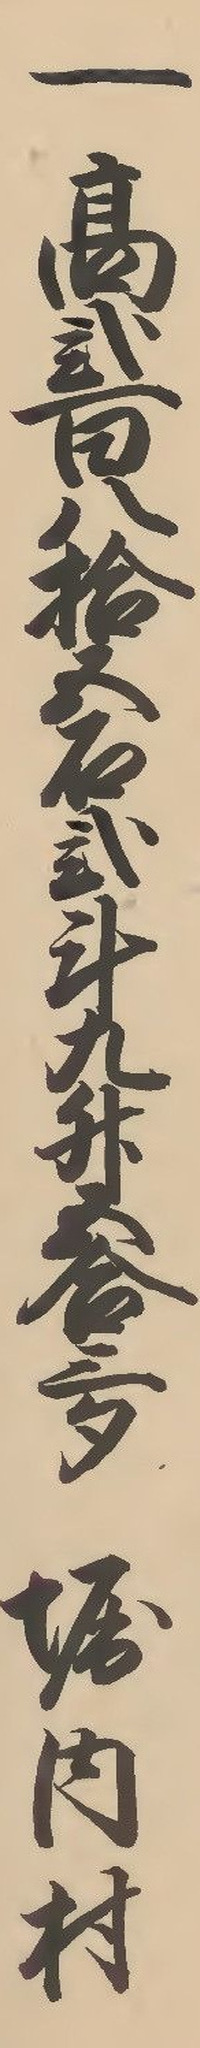一高弐百八拾五石弐斗九升五合三勺堀内村
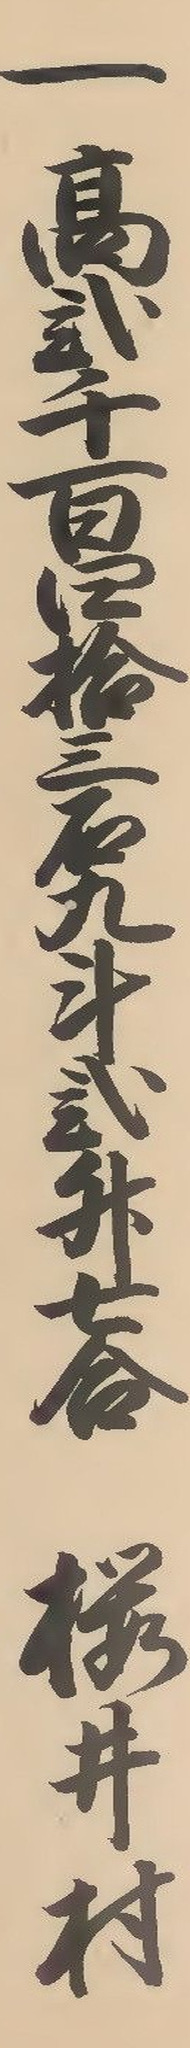一高弐千百四拾三石九斗弐升七合桜井村
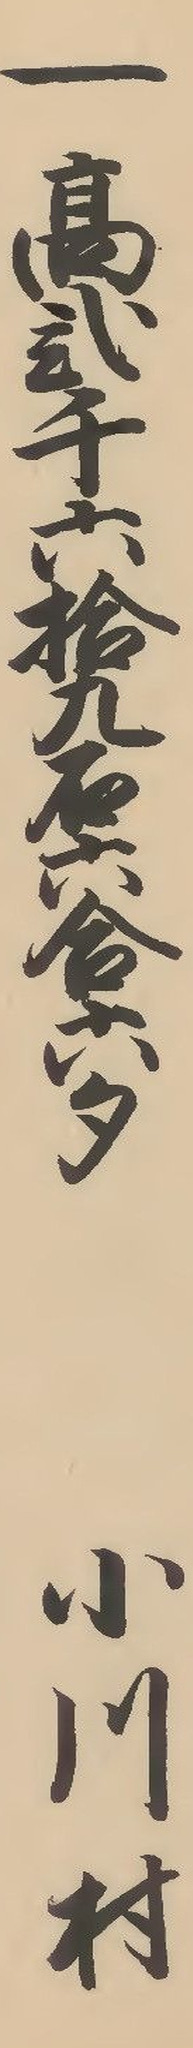一高弐千六拾九石六合六勺小川村
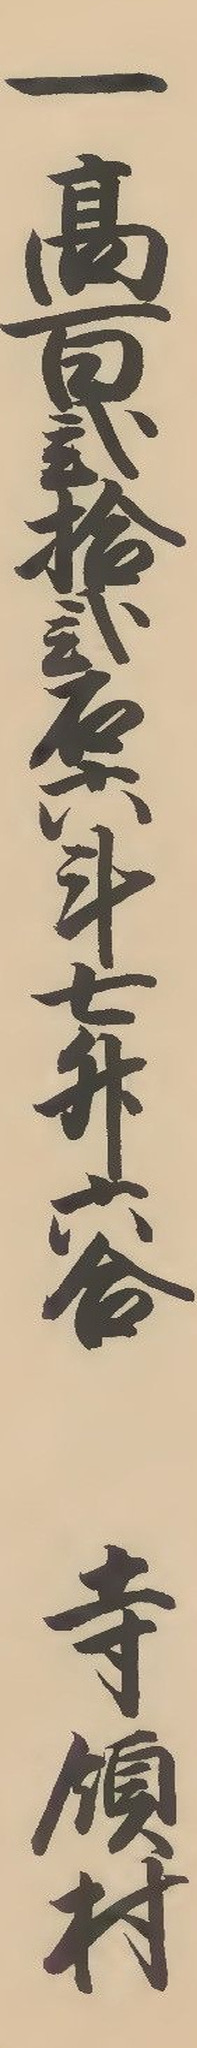一高百弐拾弐石六斗七升六合寺領村
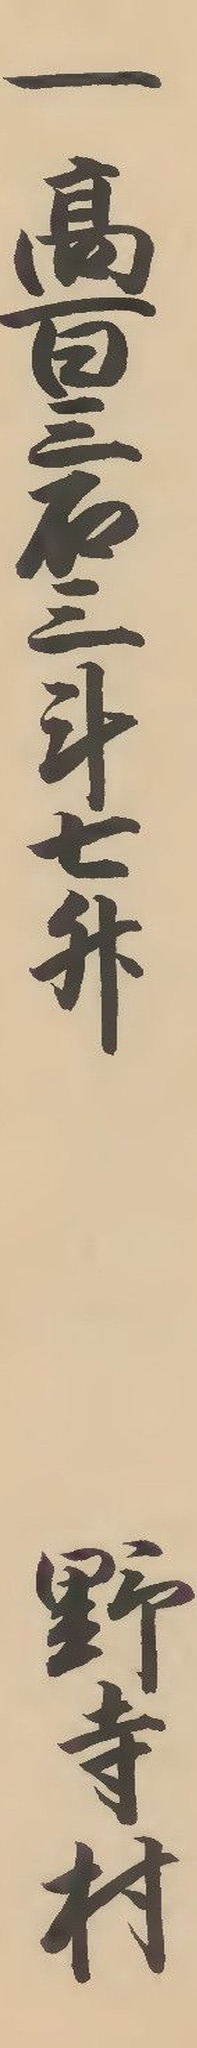一高百三石三斗七升野寺村

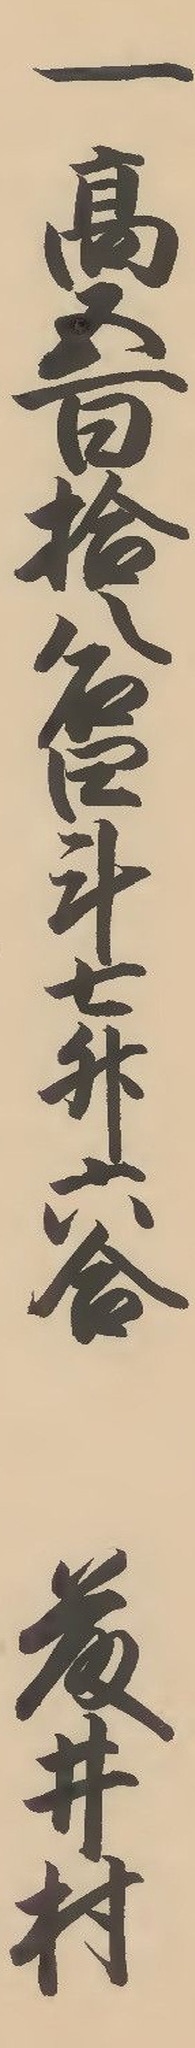一高五百拾八石四斗七升六合藤井村
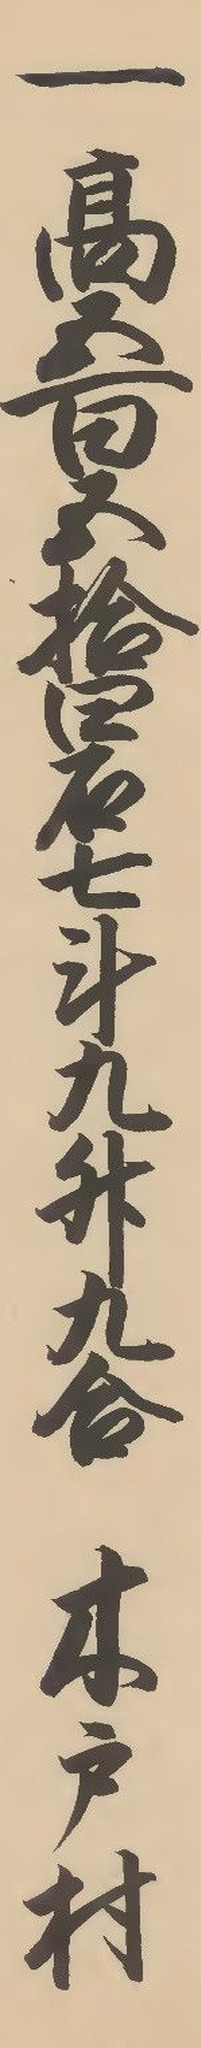一高五百五拾四石七斗九升九合木戸村
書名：三河国郷帳
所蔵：国立公文書館 National Archives of Japan
